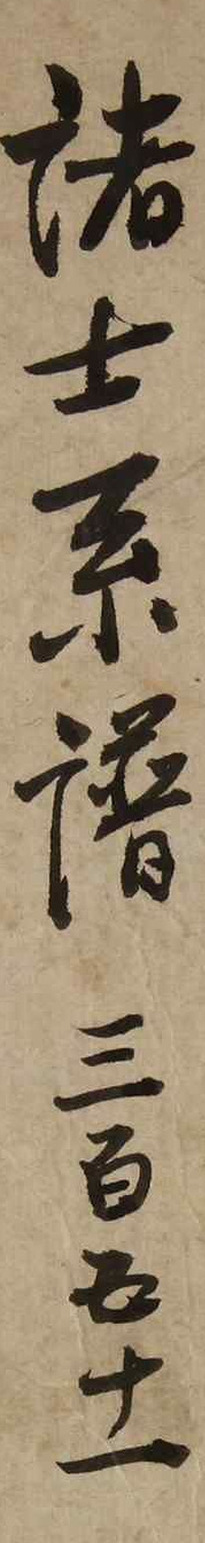諸士系譜三百五十一

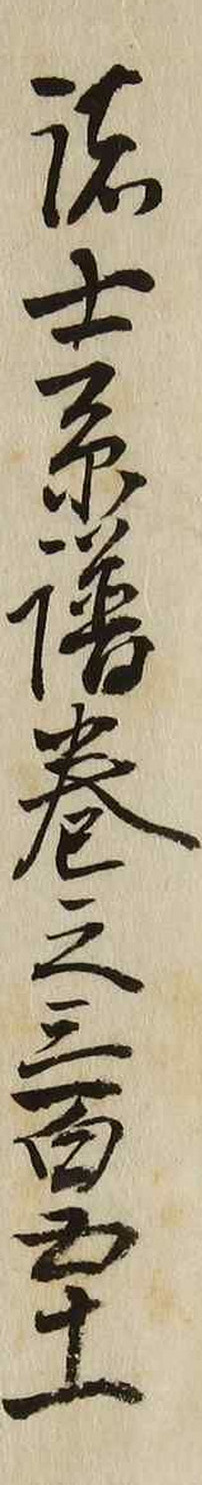諸士系譜巻之三百五十一
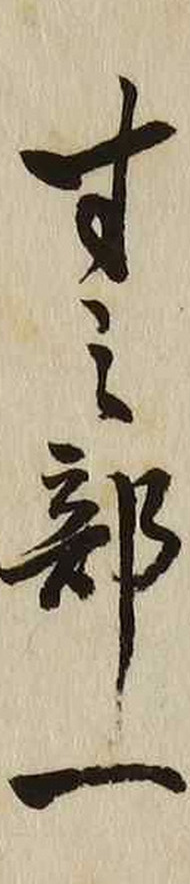す之部一
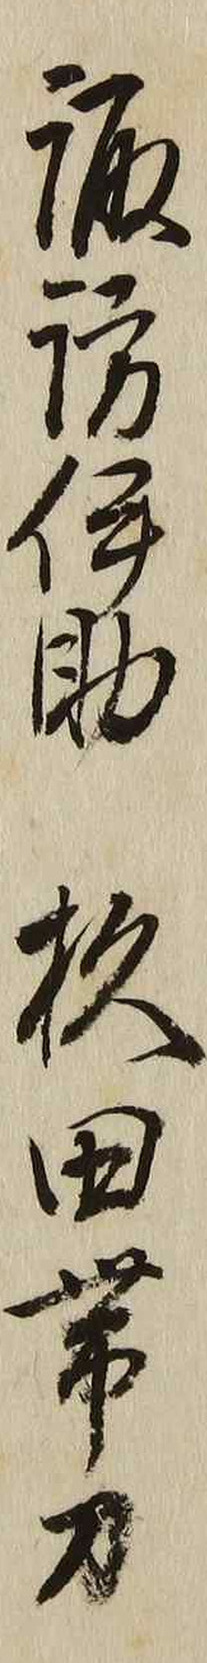諏訪伊助杉田帯刀

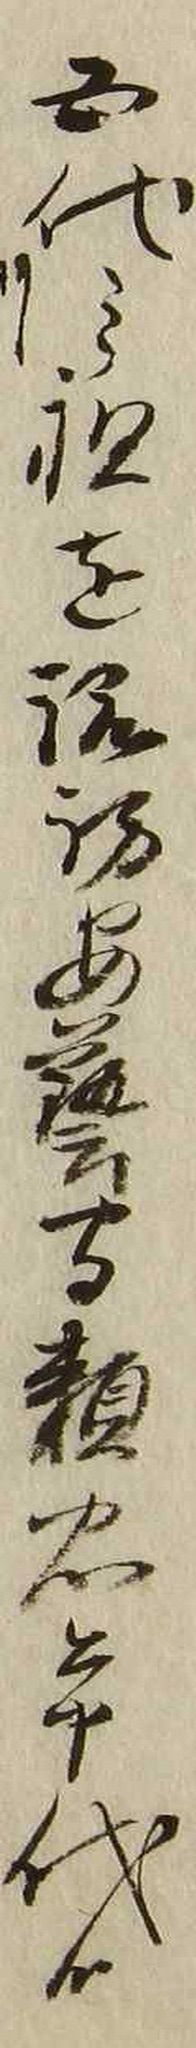五代之祖を諏訪安芸守頼忠と申代候
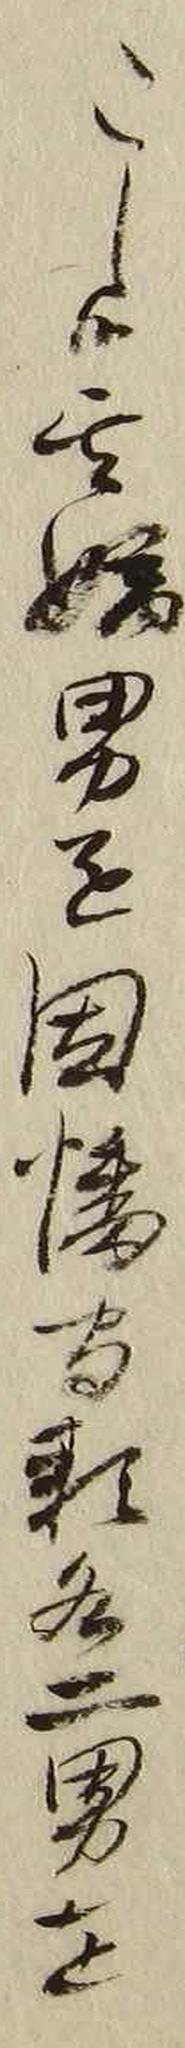たし候其嫡男を因幡守頼水二男を
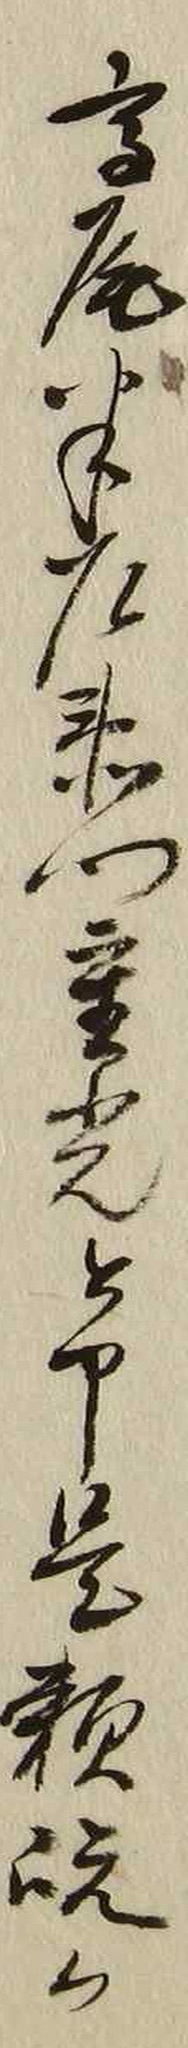高尾半左衛門重光と申是頼岏か
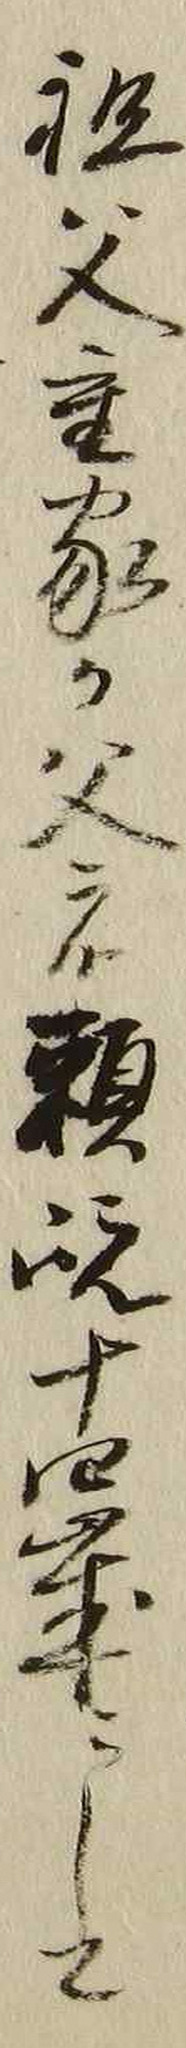祖父重家か父ニ候頼岏十四歳ニして
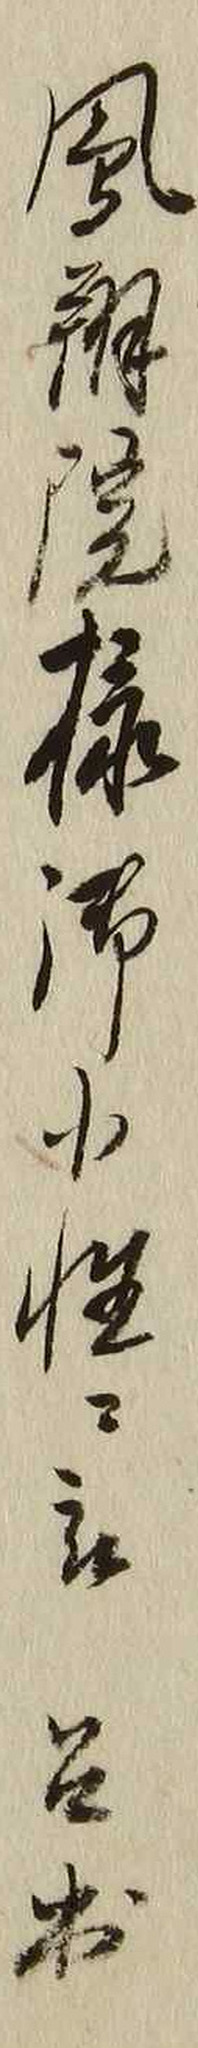鳳翔院様御小性ニ被召出
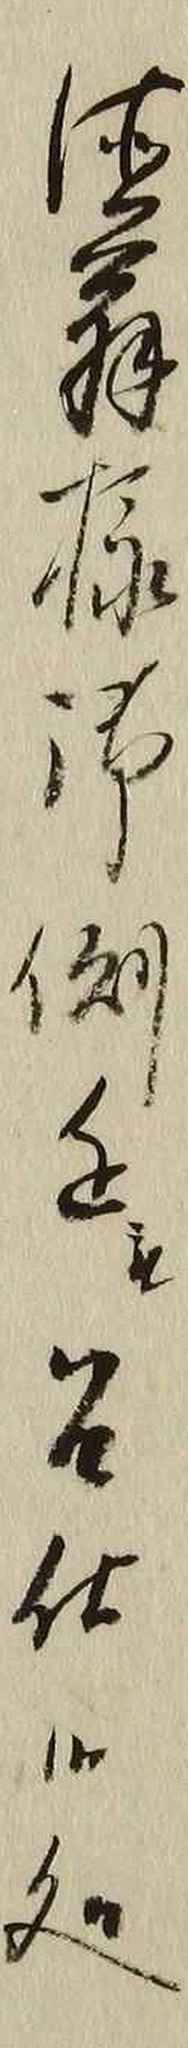徳翁様御側近被召仕候処
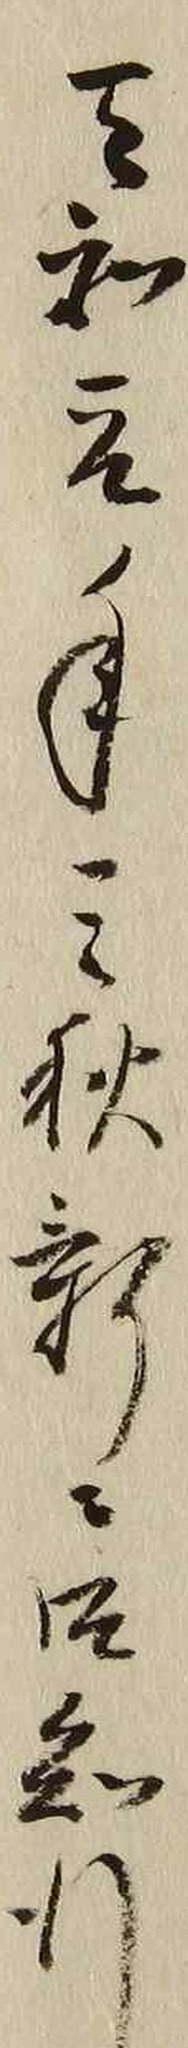天和元年之秋新ニ御知行
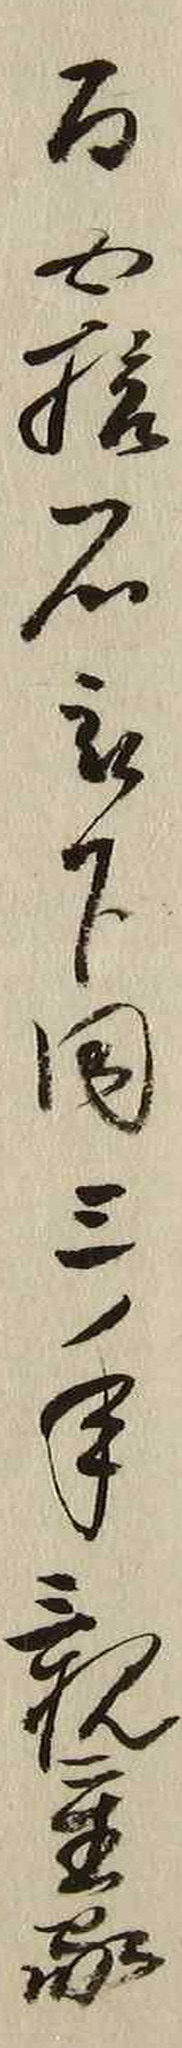百五拾石被下同三年親重家
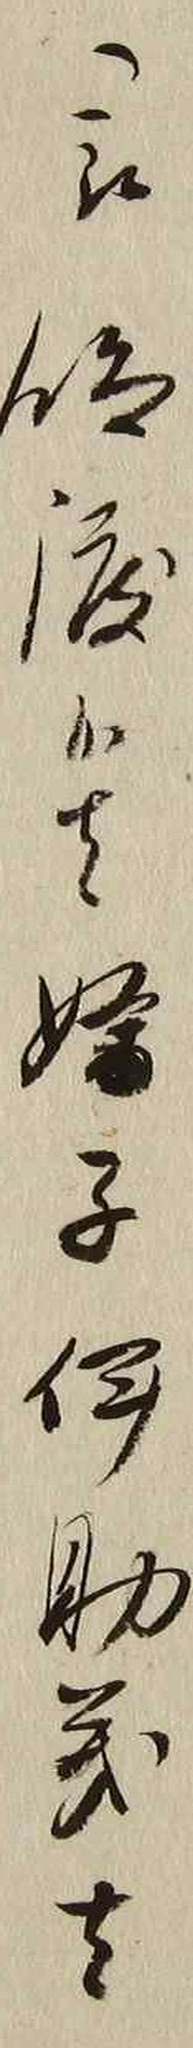へ被仰渡候者嫡子伊助義者
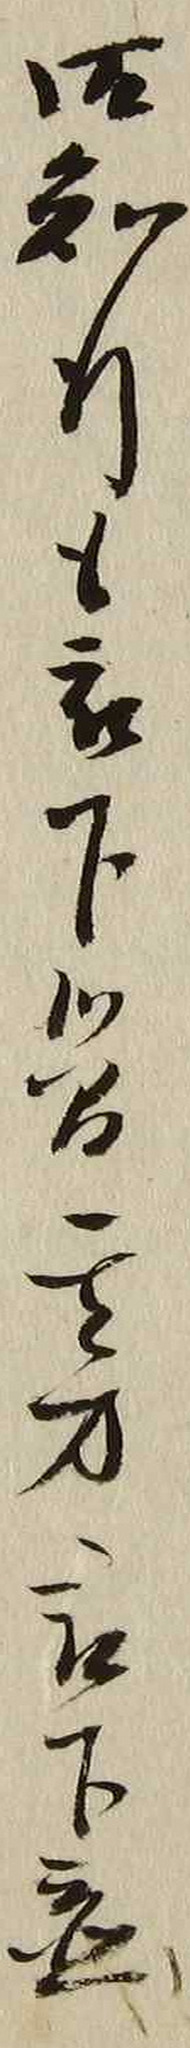御知行も被下候間其方被下置
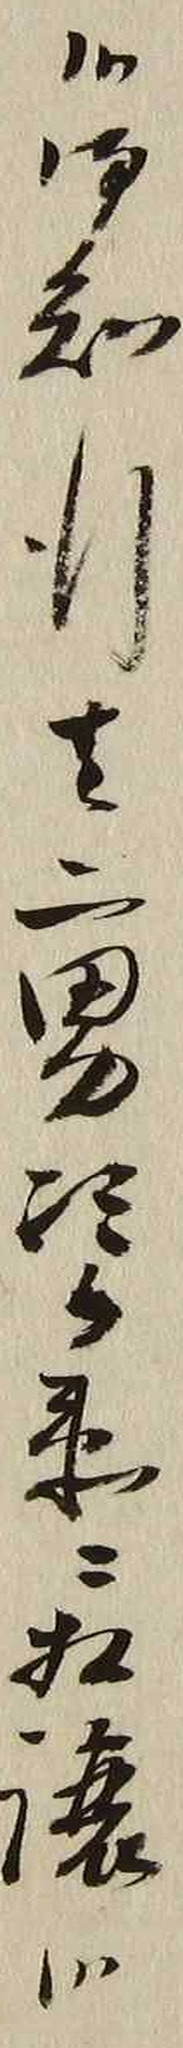候御知行者二男次兵衛ニ相譲候
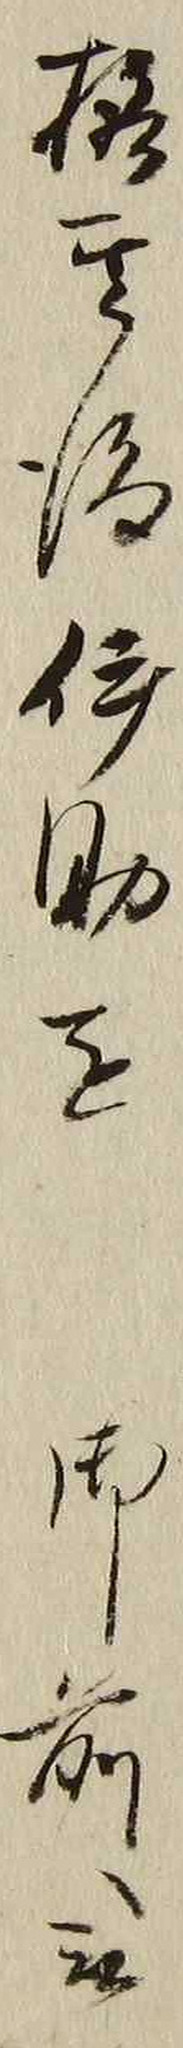様其後伊助を御前へ被
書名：諸士系譜　巻之351　す之部1
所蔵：会津若松市立会津図書館
